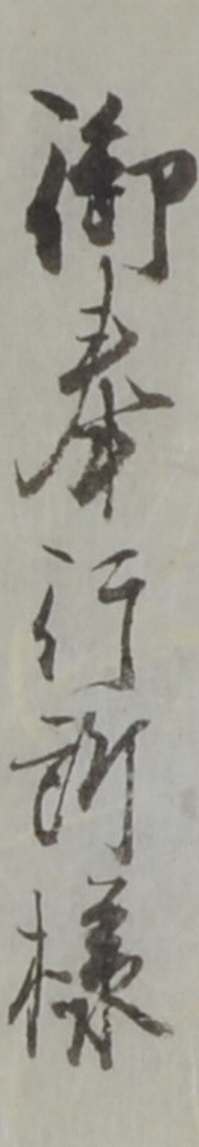御奉行所様
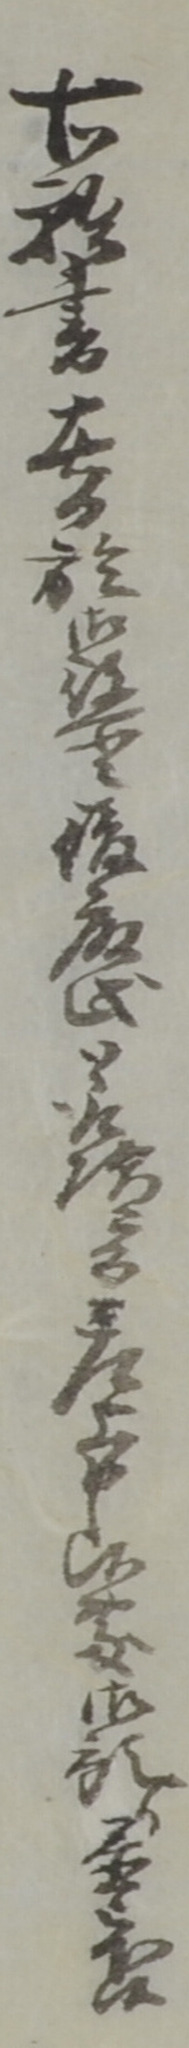右願書十七日於御役所ニ後藤氏御取次ニ而差上申候處御預り置被下候
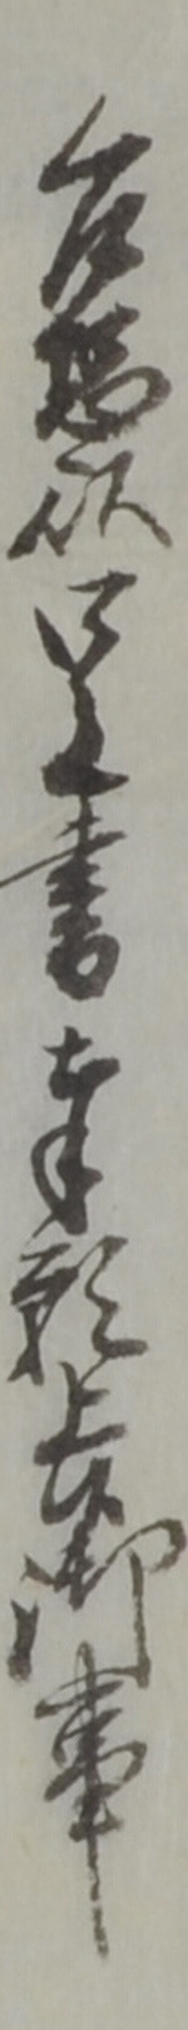乍恐以口上書奉願上候御事
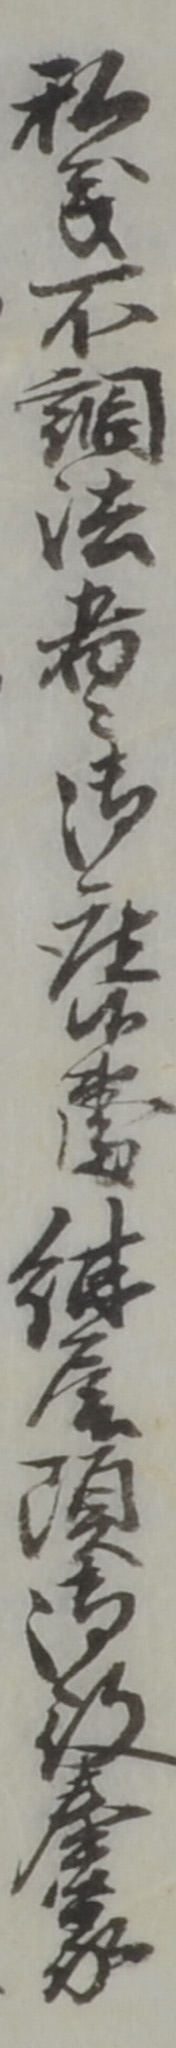私義不調法者ニ御座候處紺屋頭御役奉蒙
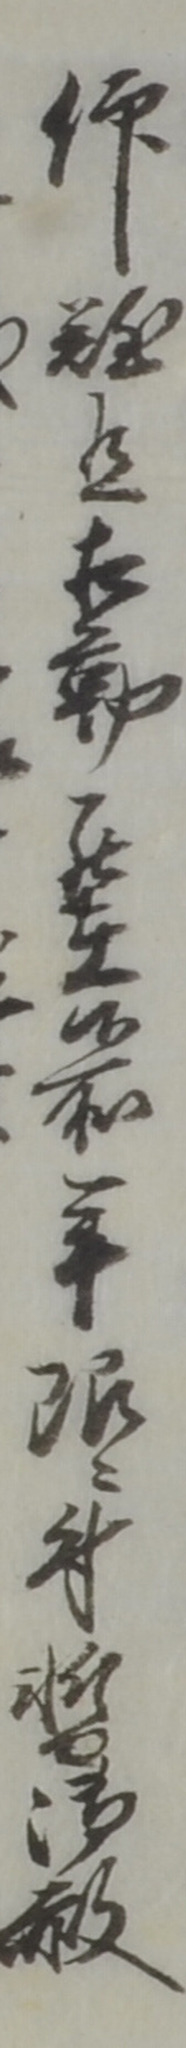仰難有相勤存罷在候所年限ニ付暫御赦
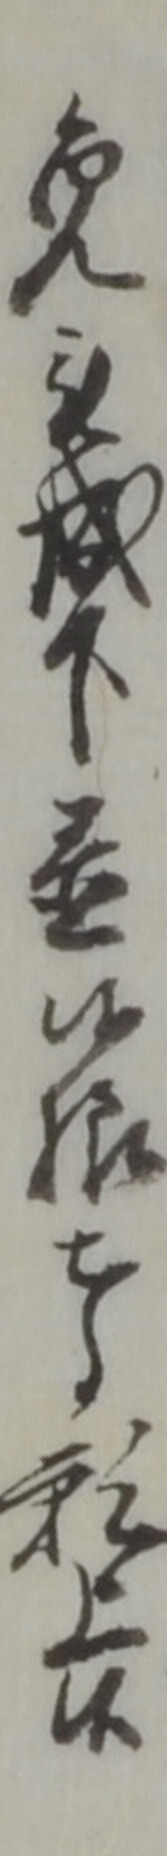免被成下置候様奉願上候
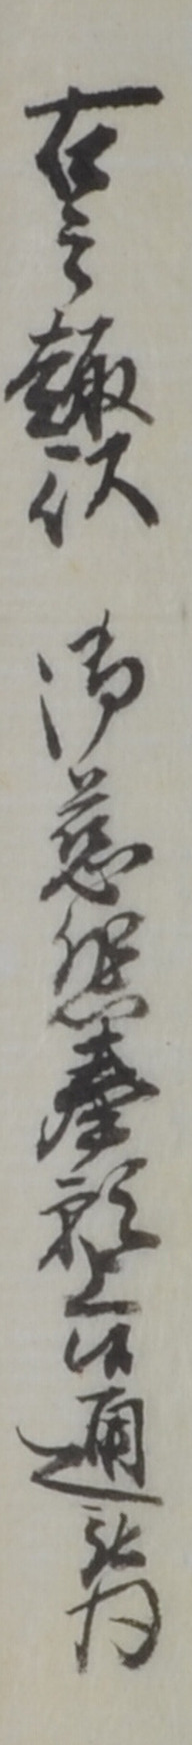右之趣以御慈悲奉願上候通被為仰付
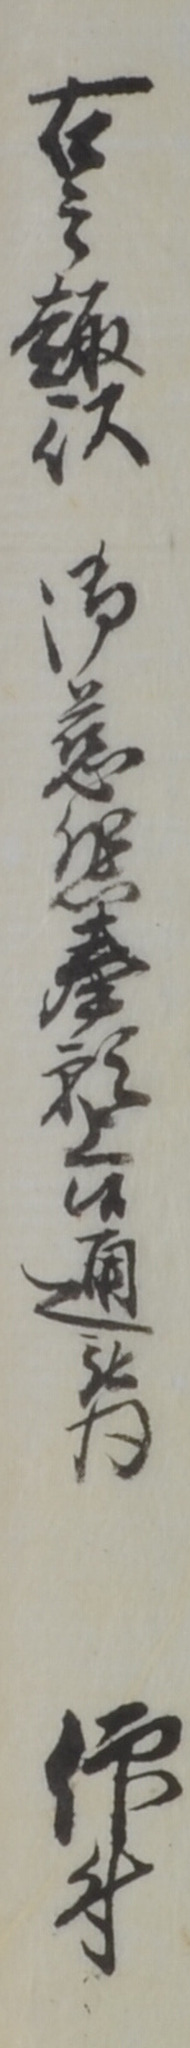右之趣以御慈悲奉願上候通被為仰付
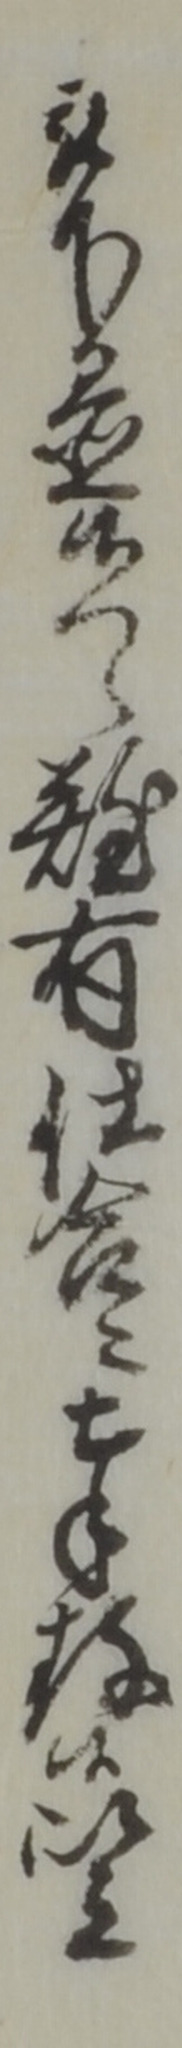被下置候ハヽ難有仕合ニ奉存候以上
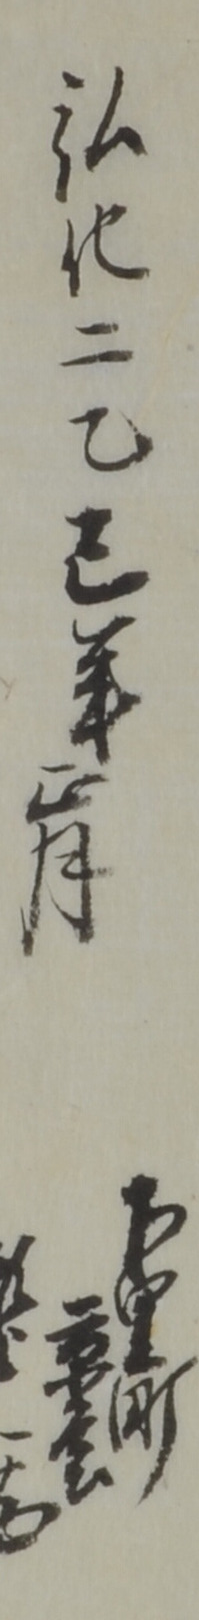弘化二乙巳年正月下里町
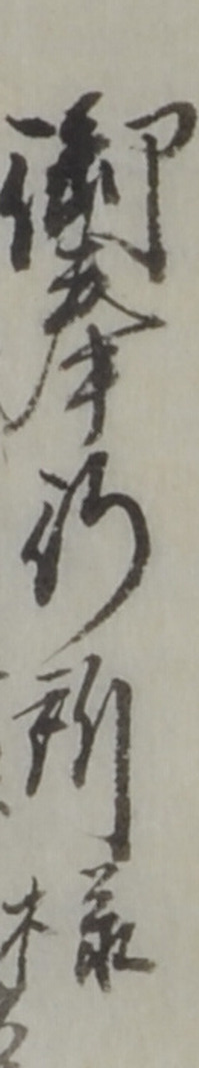御奉行所様
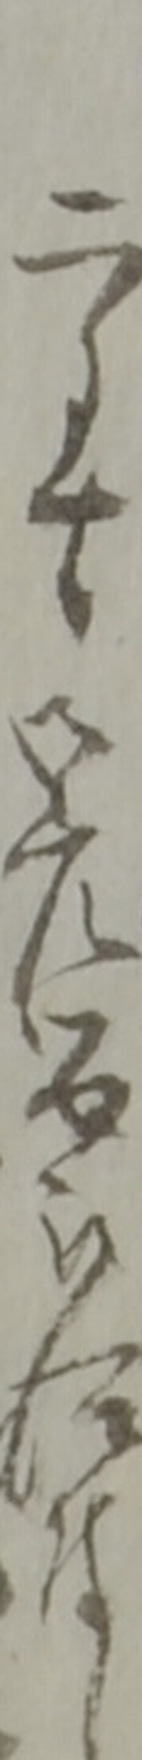二月十日御差留被仰付候
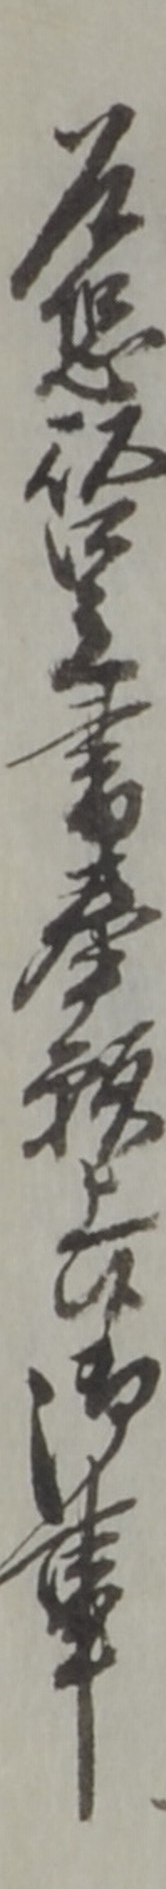乍恐以口上書奉願上候御事
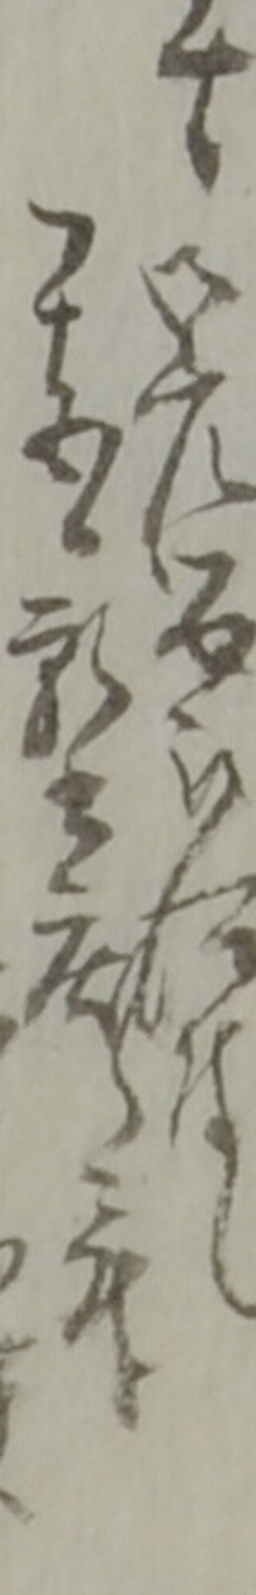同十五日願書戻りニ付
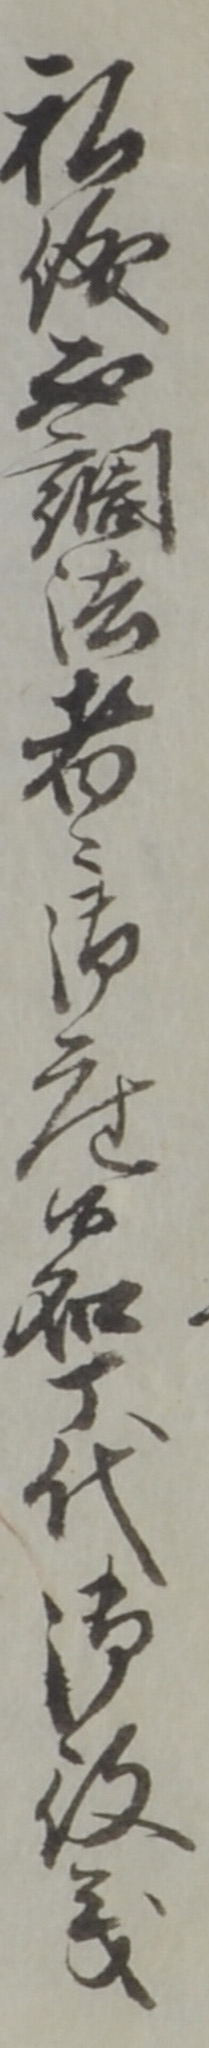私儀不調法者ニ御座候処丁代御役義
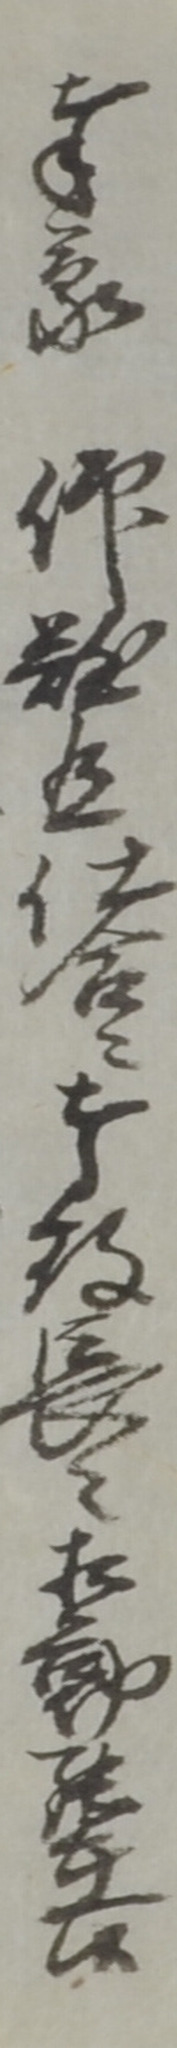奉蒙仰難有仕合ニ奉存長々相勤罷在候
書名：諸願書控簿
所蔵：伊那市立高遠町図書館・合同会社AMANE
